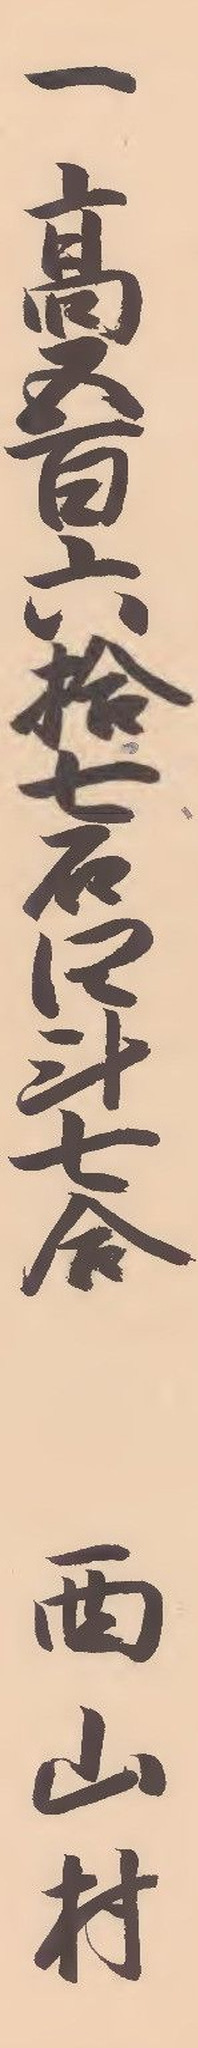一高五百六拾七石四斗七合西山村

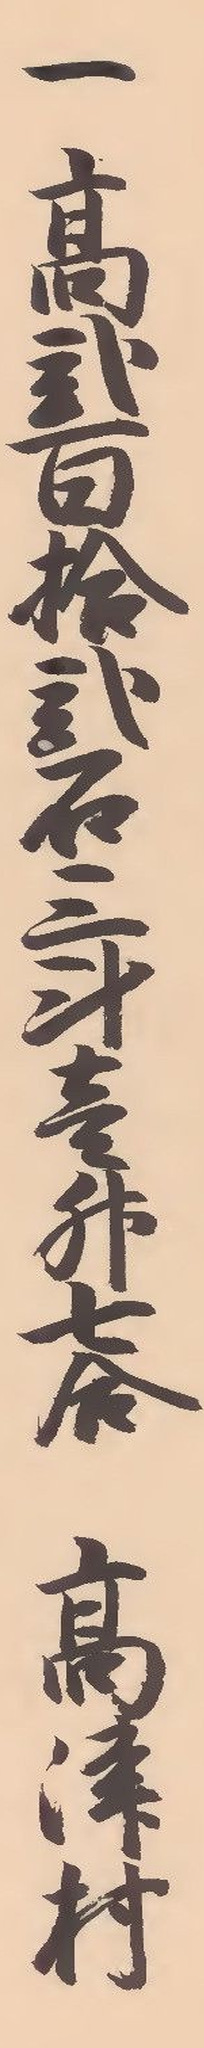一高弐百拾弐石三斗壱升七合高津村
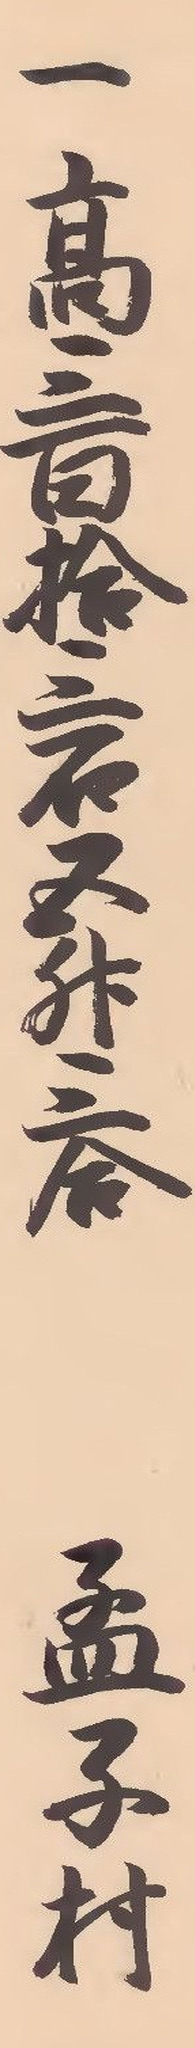一高三百拾三石五升三合孟子村
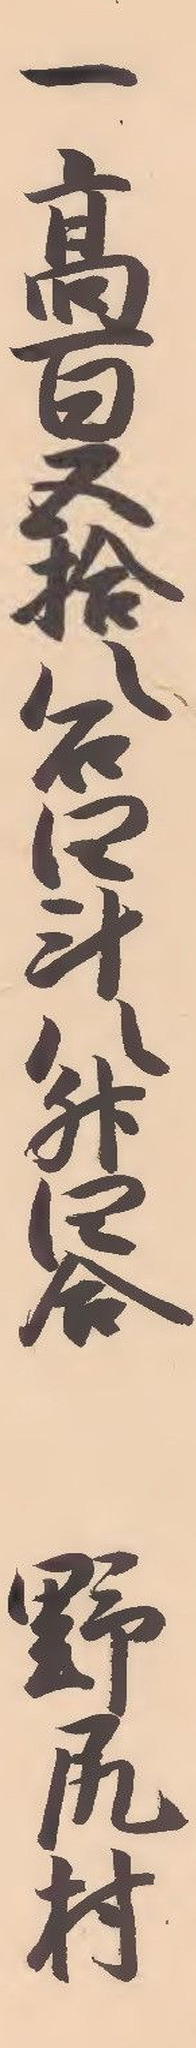一高百五拾八石四斗八升四合野尻村
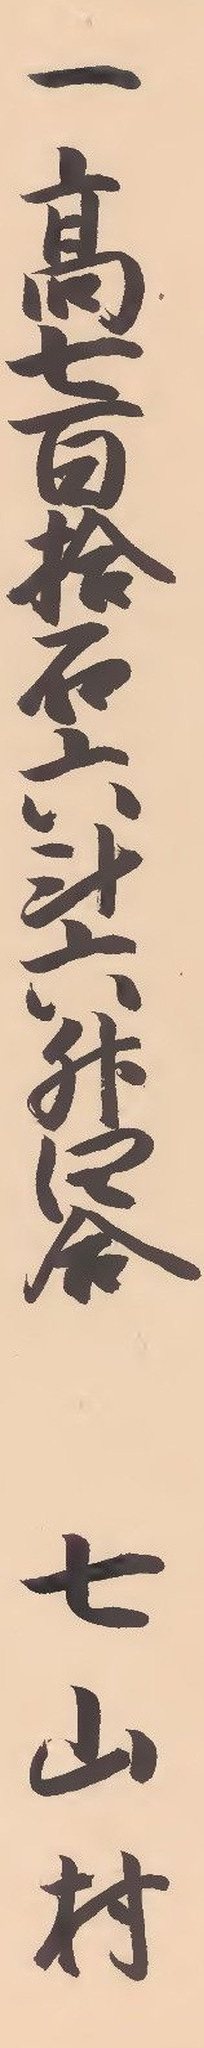一高七百拾石六斗六升四合七山村
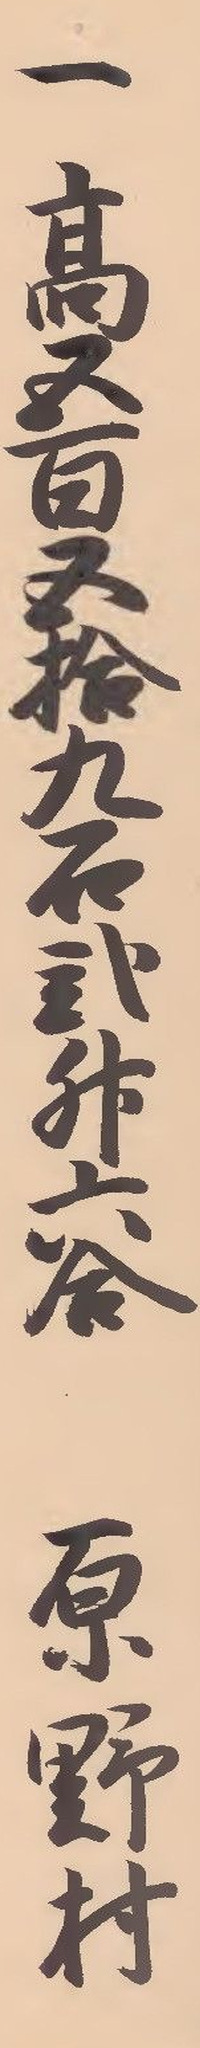一高五百五拾九石弐升六合原野村
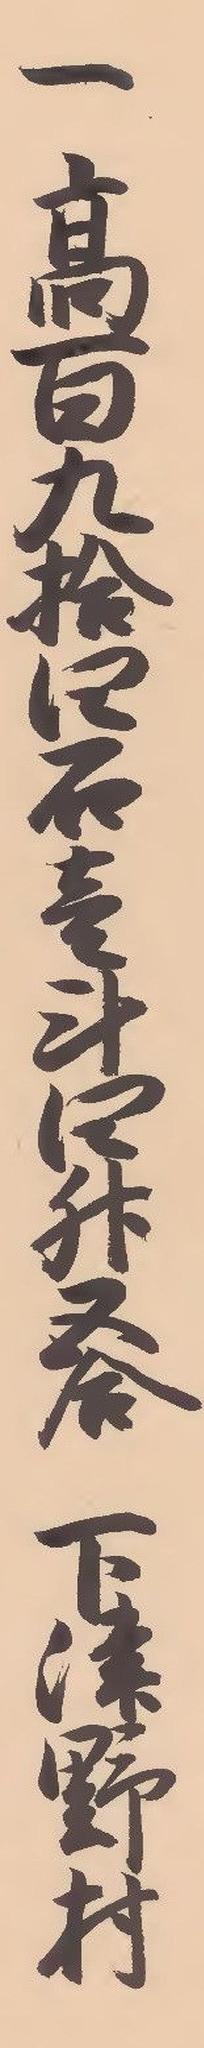一高百九拾四石壱斗四升五合下津野村
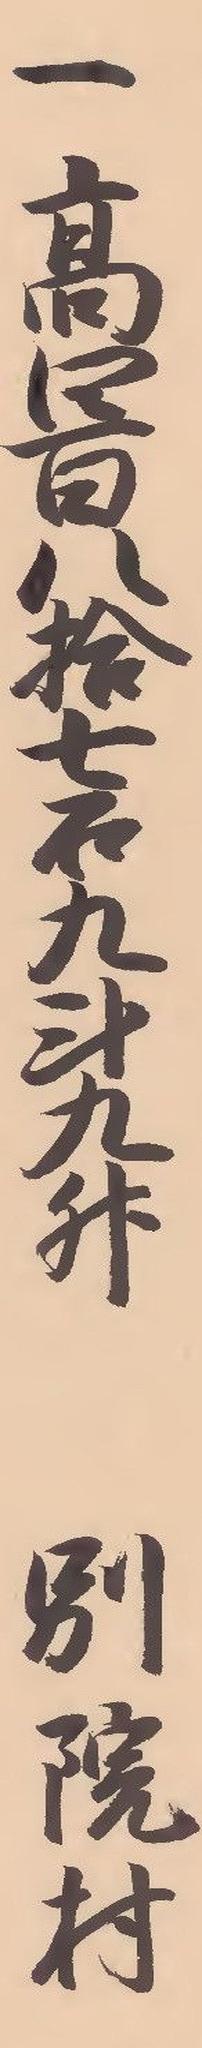一高四百八拾七石九斗九升別院村
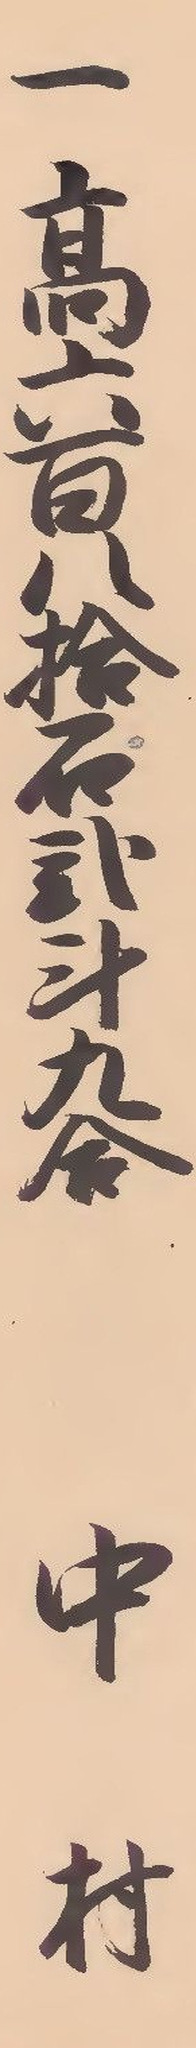一高六百八拾石弐斗九合中村

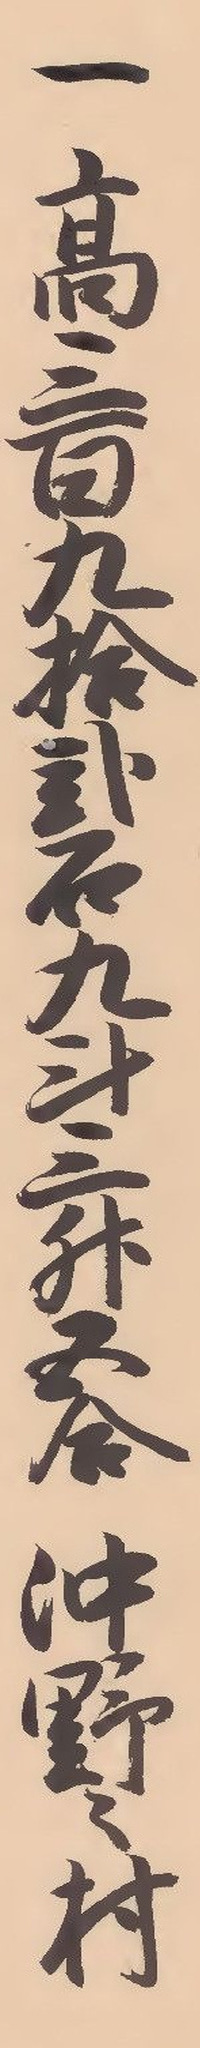一高三百九拾弐石九斗三升五合沖野々村
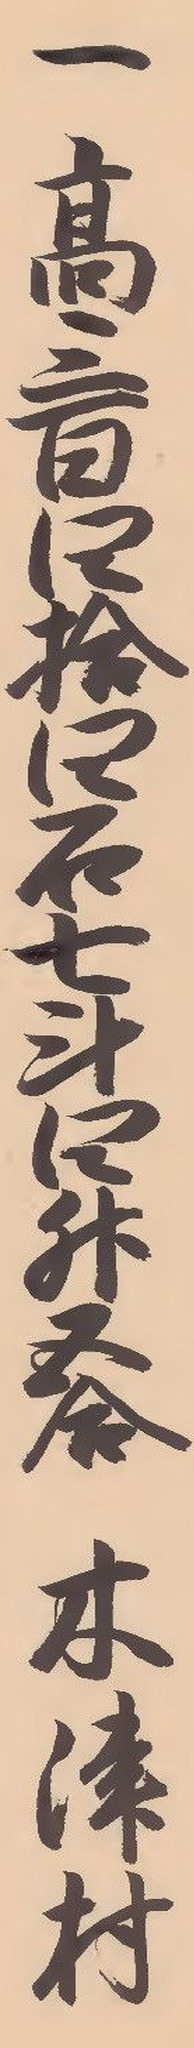一高三百四拾四石七斗四升五合木津村
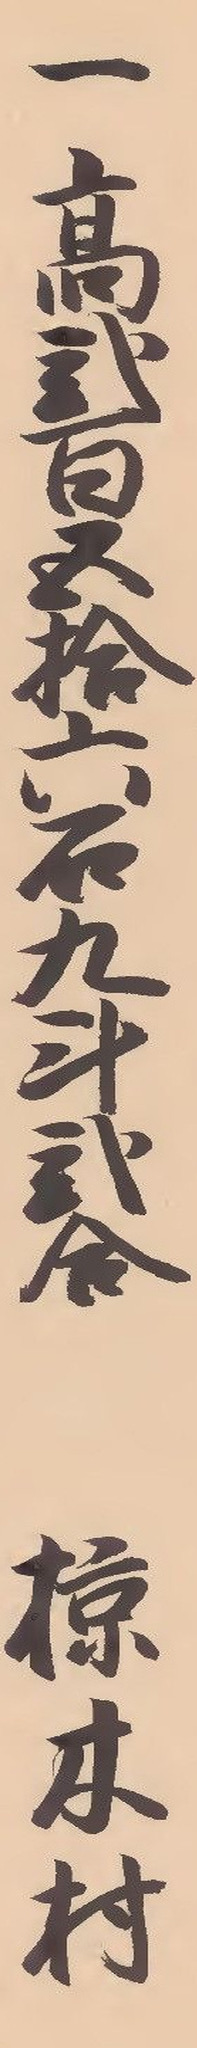一高弐百五拾六石九斗弐合椋木村
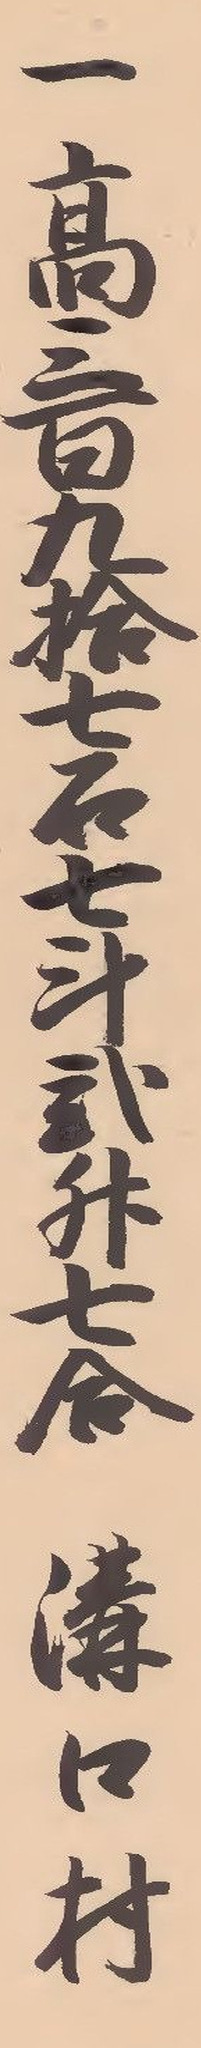一高三百九拾七石七斗弐升七合溝口村
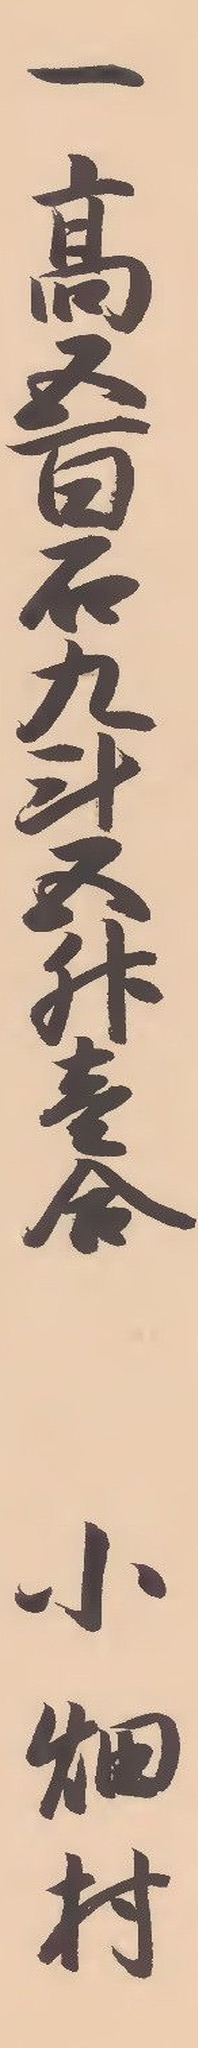一高五百石九斗五升壱合小畑村
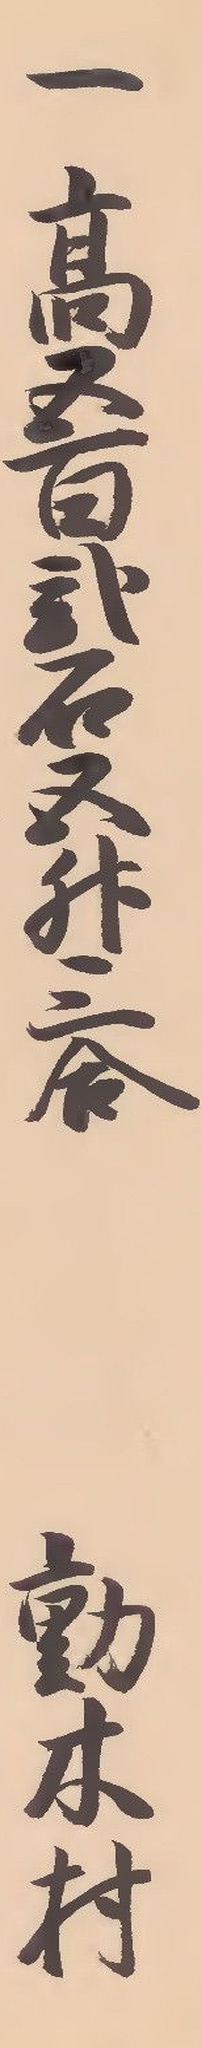一高五百弐石五升三合動木村
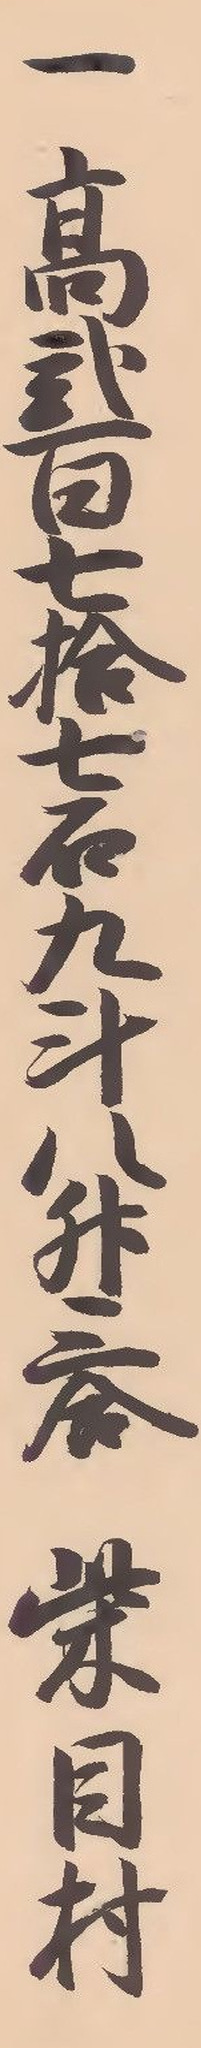一高弐百七拾七石九斗八升三合柴目村
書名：紀伊国郷帳
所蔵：国立公文書館 National Archives of Japan
